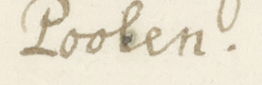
Poolen.
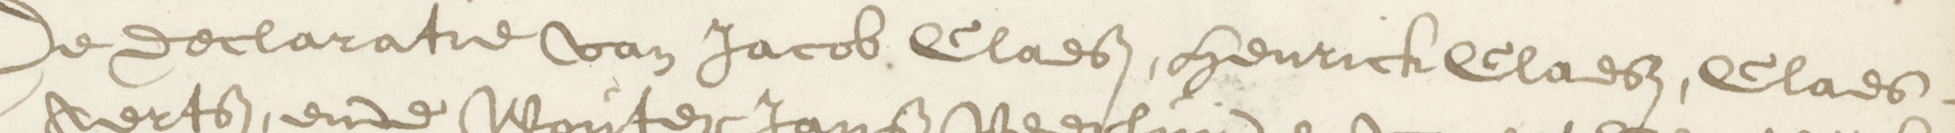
De declaratie van Jacob. Claesz, henrick Claesz, Claes —.
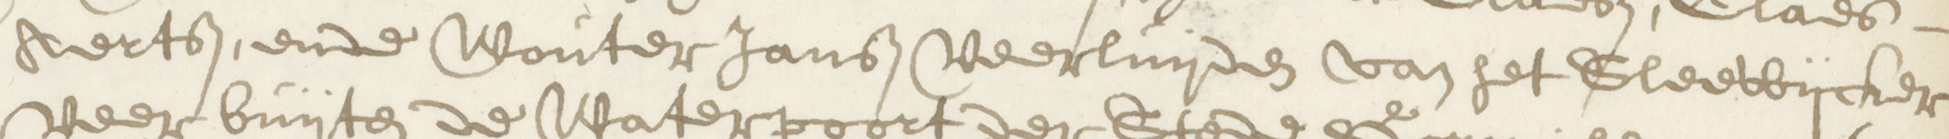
Aertsz, ende Wouter Jansz Veerluijden van het Sleewijcker
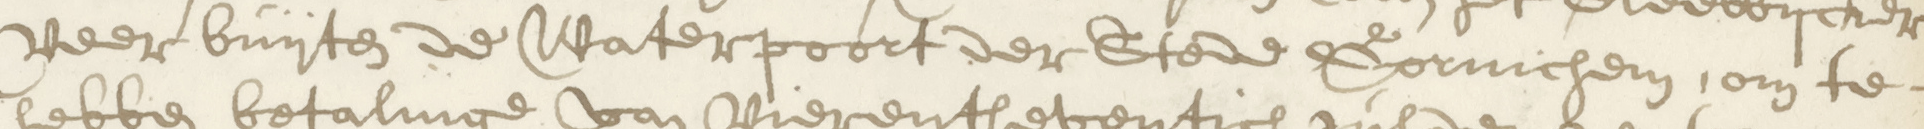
Veer buijten de Waterpoort der Stede Gornichem, om te —
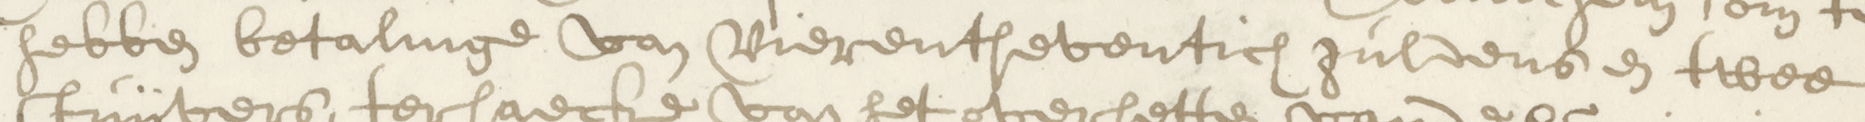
hebben betalinge van vierentseventich guldens en twee
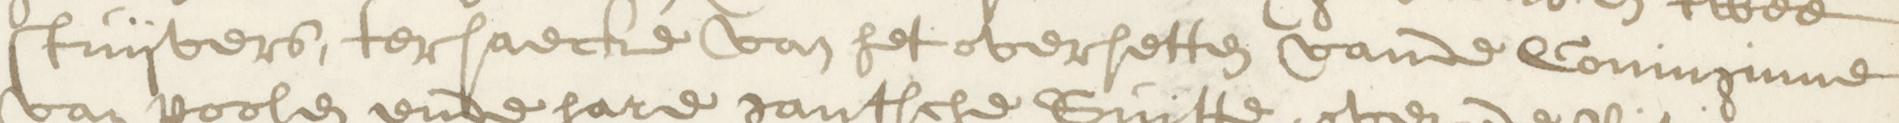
stuijvers, ter saecke van het oversetten vande Coninginne
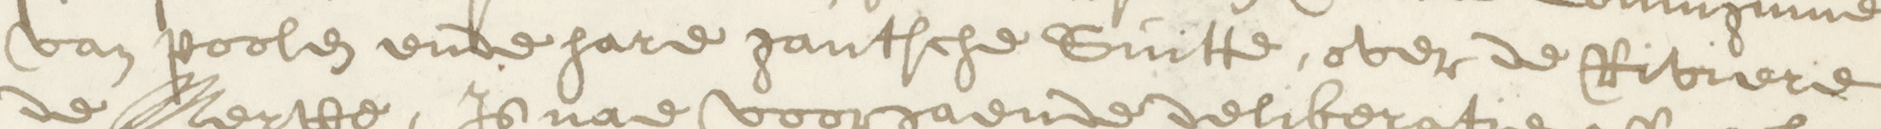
van Poolen ende hare gantsche Suitte, over de Riviere
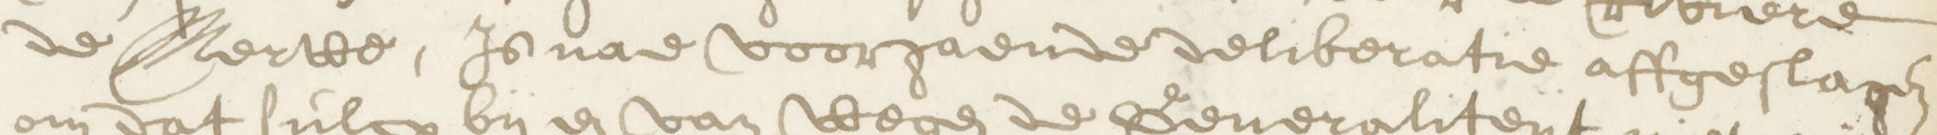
de Merwe, Is nae voorgaende deliberatie affgeslagen,
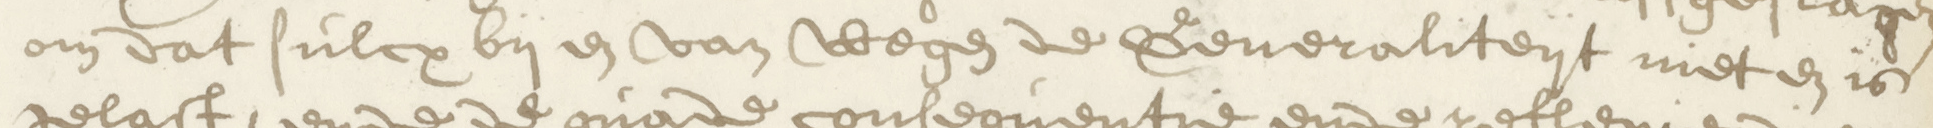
om dat sulcx bij en van wegen de Generaliteyt niet en is
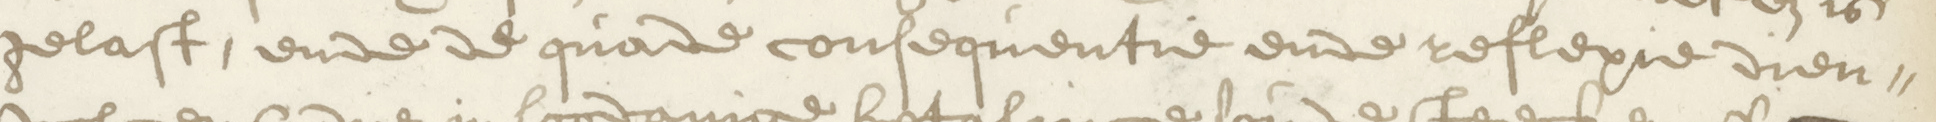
gelast, ende de quade consequentie ende reflexie dien„
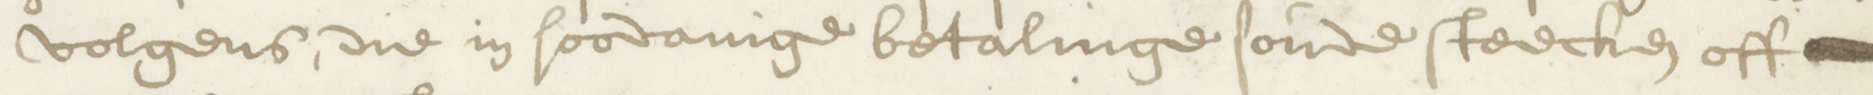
volgens, die in soodanige betalinge soude steecken off —
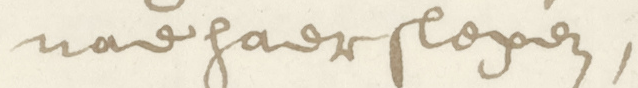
nae haer slepen.
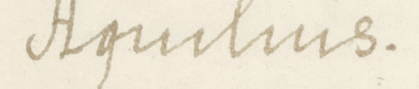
Aquilius.
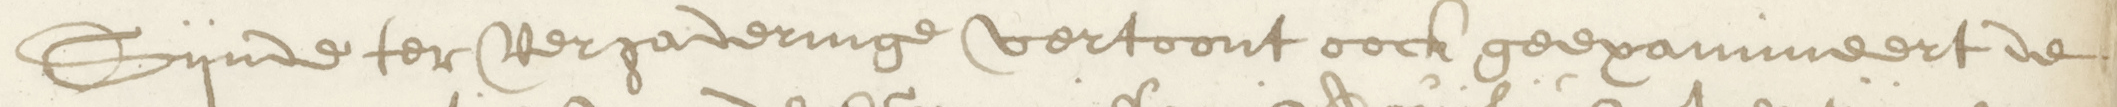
Sijnde ter Vergaderinge vertoont oock geexamineert de
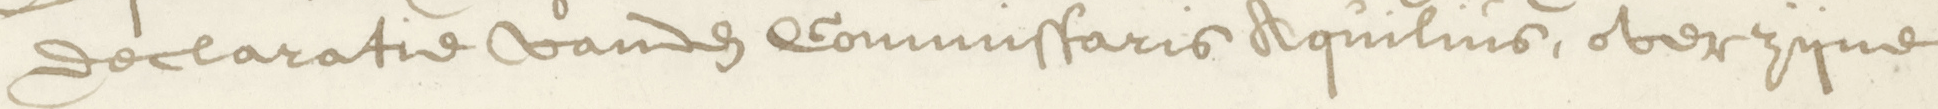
Declaratie vanden Commissaris Aquilius, over zijne
